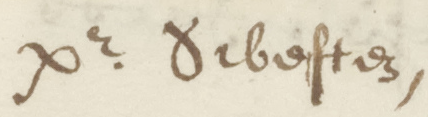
Pr. Swesten.
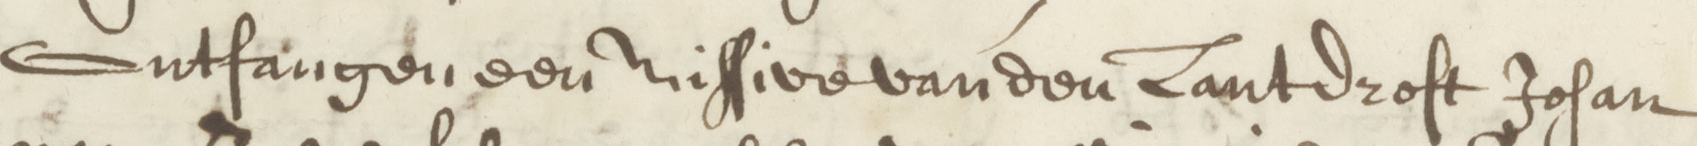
Ontfangen een Missive van den Lantdrost Johan
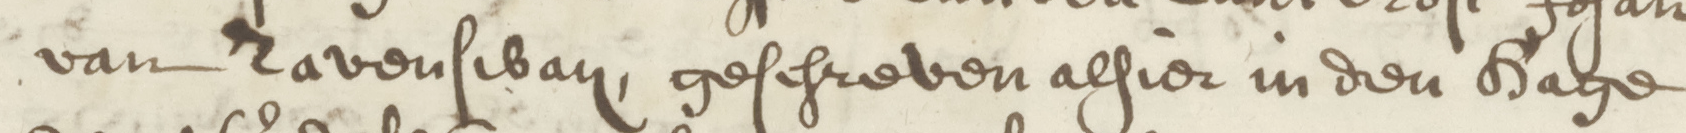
van Ravensway, geschreven alhier in den Hage
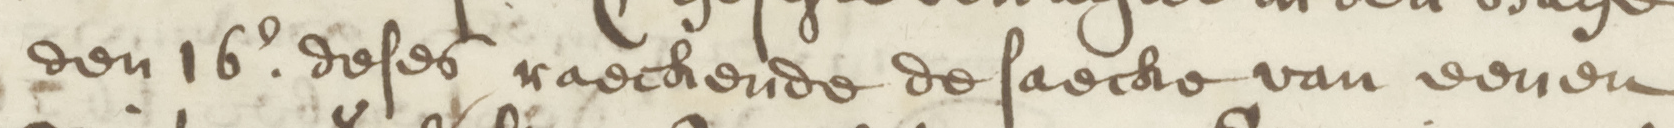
den 16e. deses raeckende de saecke van eenen
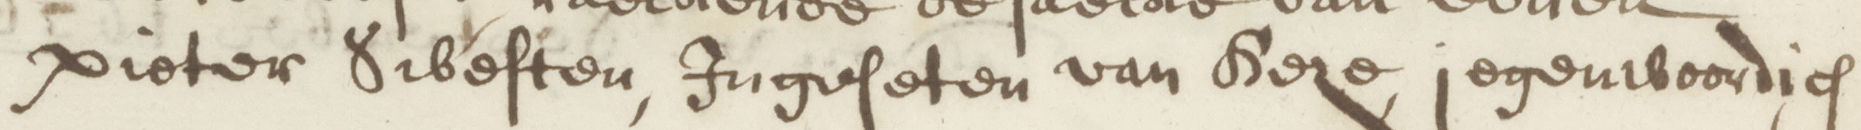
Pieter Swesten, Ingeseten van Heze jegenwoordich
